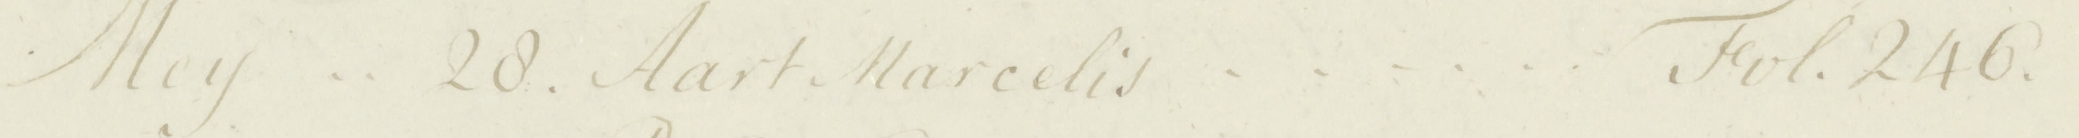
Mey. . 28. Aart Marcelis...... Fol. 246.
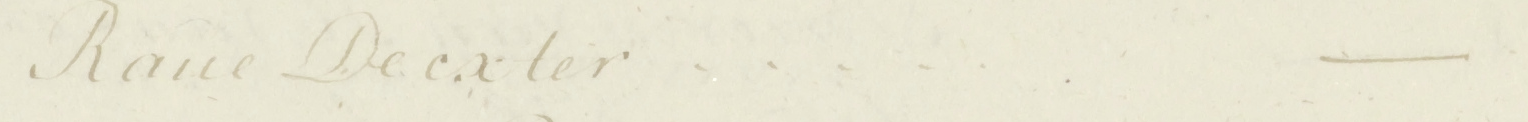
Raue Decxter.... —
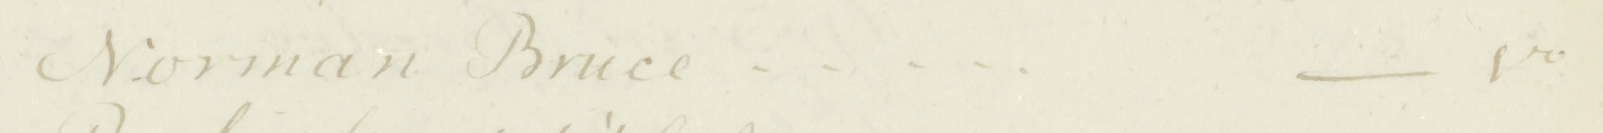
Norman Bruce..... — Vo.
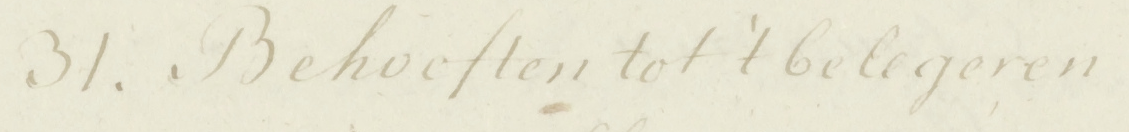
31. Behoeften tot ‛t belegeren
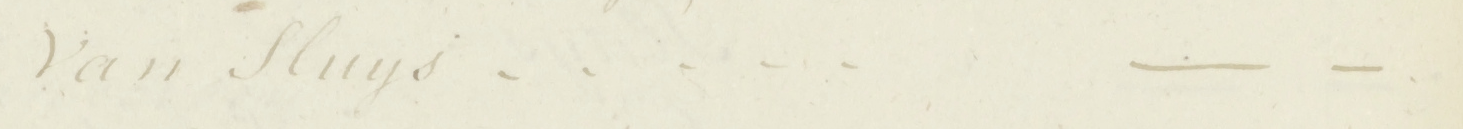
Van Sluys..... — -
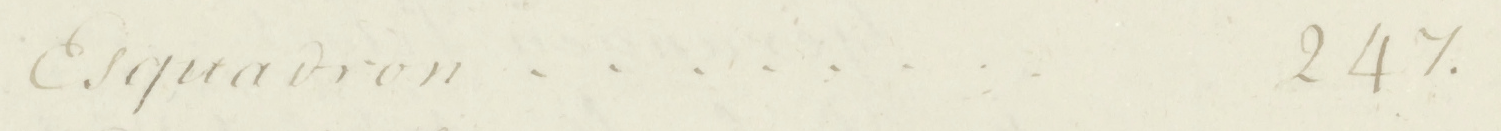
Esquadron....... 247.
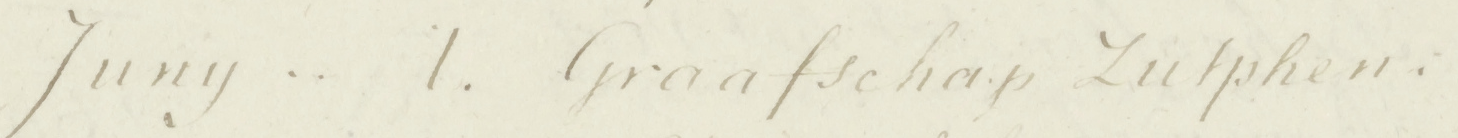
Juny.. 1. Graafschap Zutphen.
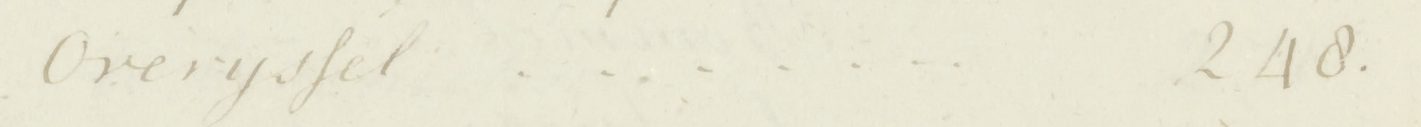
Overyssel........248.
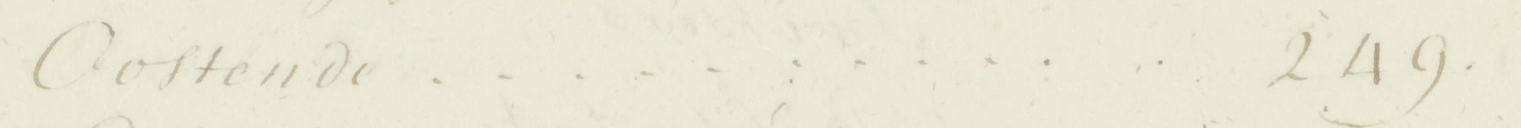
Oostende..........249.
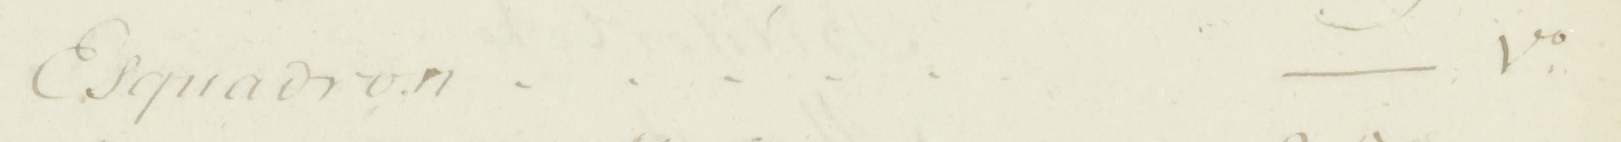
Esquadron.....— Vo.
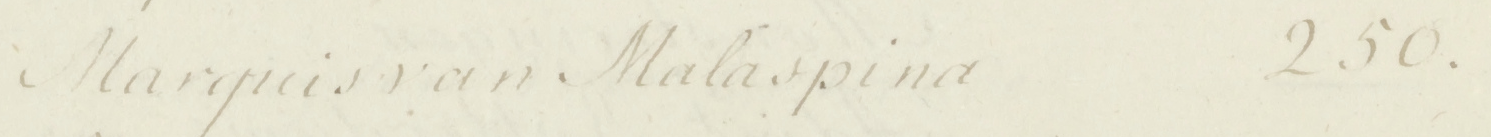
Marquis van Malaspina 250.
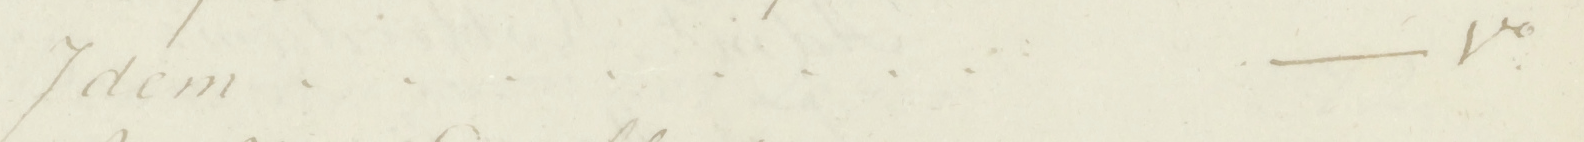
Idem........— Vo.
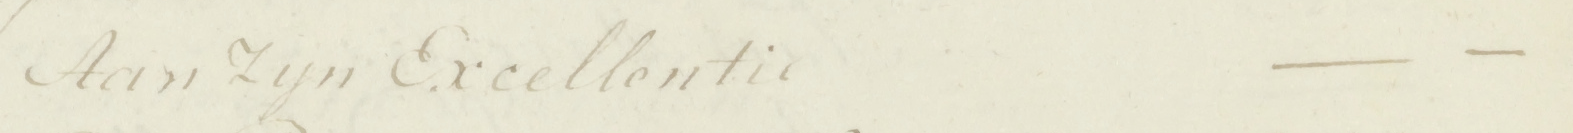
Aan Zyn Excellentie — -
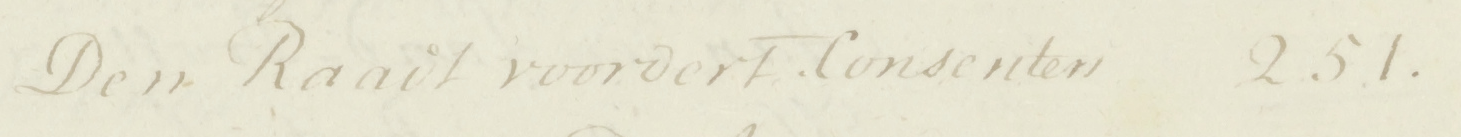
Den Raadt voordert Consenten 251.
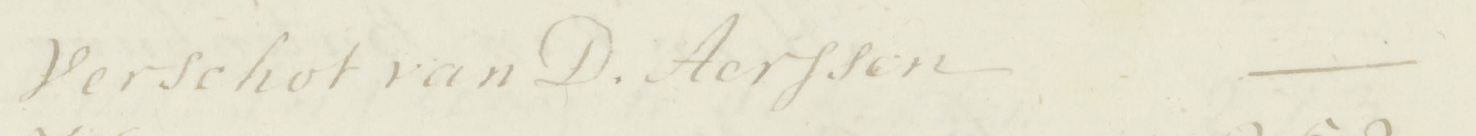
Verschot van D. Aerssen —
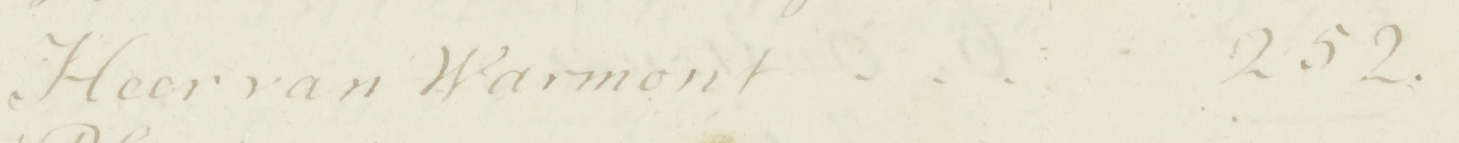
Heer van Warmont... 252.
